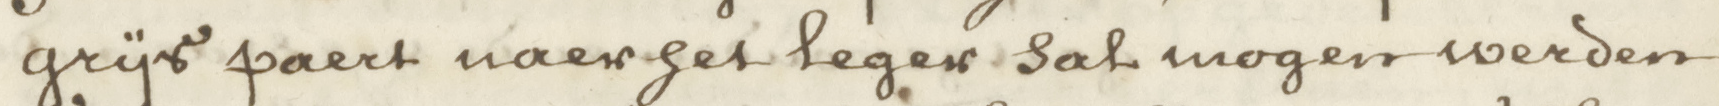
grijs paert naer het leger sal mogen werden
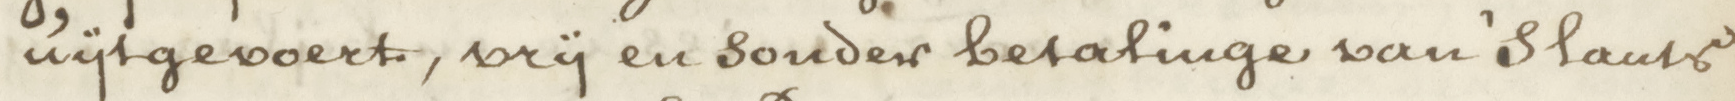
uijtgevoert, vrij en sonder betalinge van ‛slants
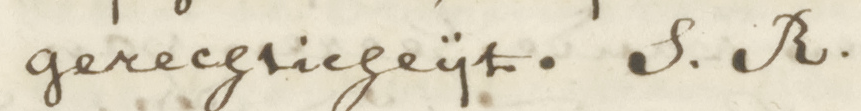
gerechticheijt. S.R.
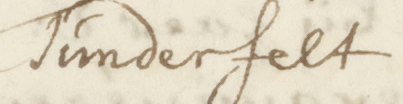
Tunderfelt
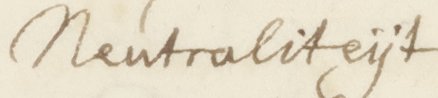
Neutraliteijt
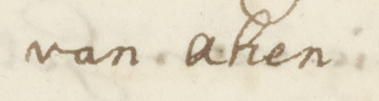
van Aken
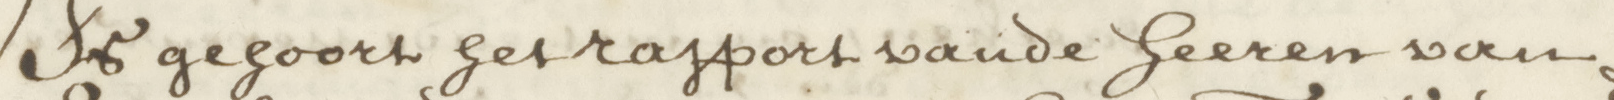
Is gehoort het rapport vande heeren van
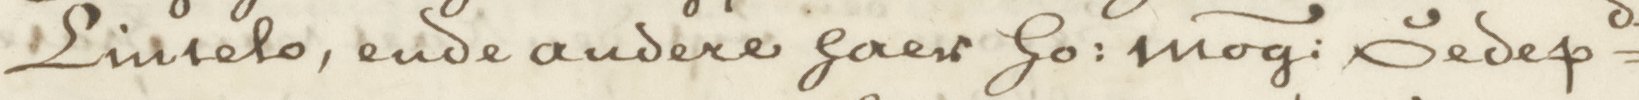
Lintelo, ende andere haer Ho:Mog: Gedepden:
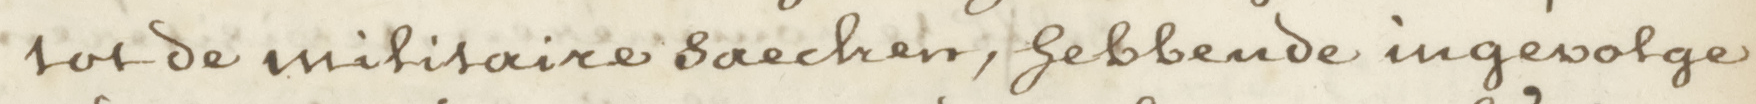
tot de militaire saecken, hebbende ingevolge
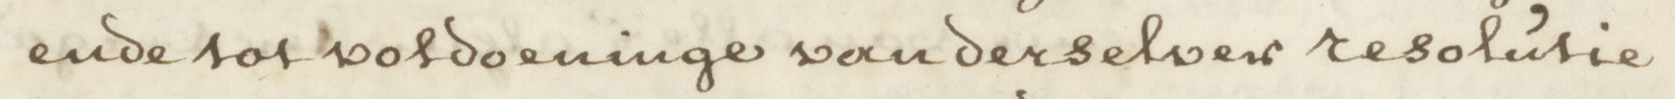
ende tot voldoeninge van derselver resolutie
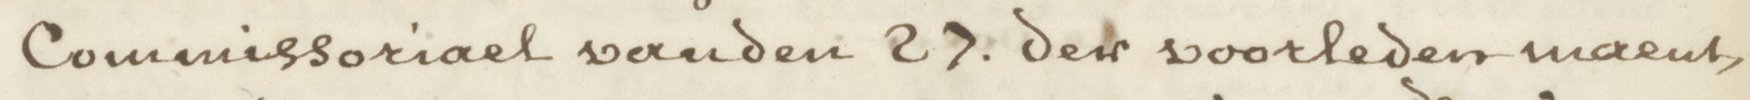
Commissoriael vanden 27. der voorleden maent,
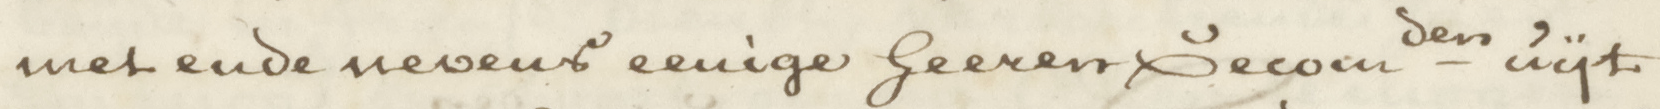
met ende nevens eenige heeren Gecomden uijt
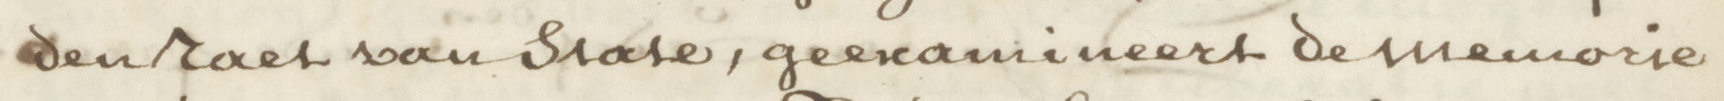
den Raet van State, geexamineert de memorie
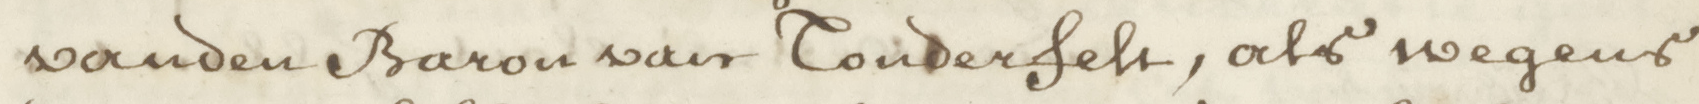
vanden Baron van Tonderfelt, als wegens
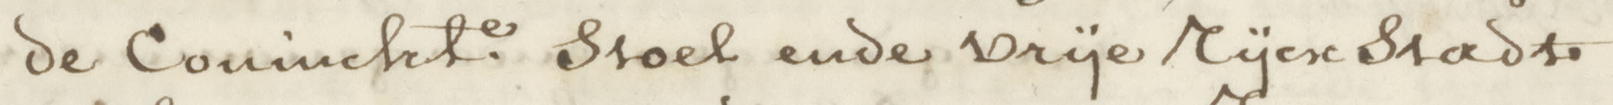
de Coninckle. Stoel ende Vrije Rijcx Stadt
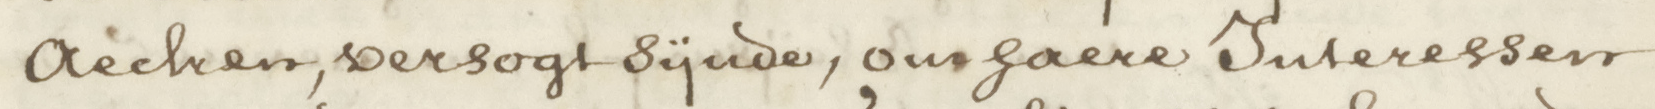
Aecken, versogt sijnde, om haere Interessen
